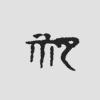祀
